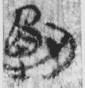解
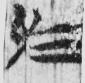於
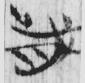歲（歲）
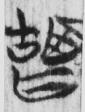○（盬）
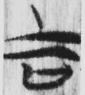吉
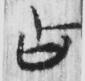占
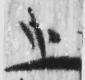之
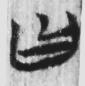曰
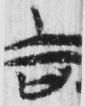吉
